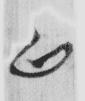㠯（以）
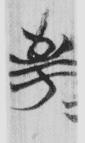{至于}=
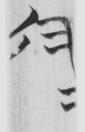今=
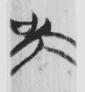吳
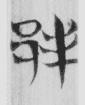邦
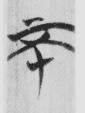不
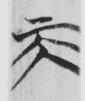天
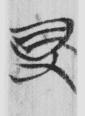𠭁
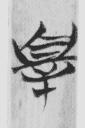辠
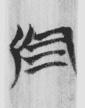於
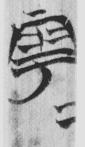雨于=
